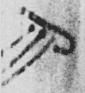勿
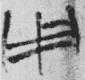用
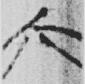六
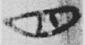四
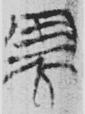需
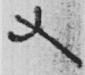又（有）
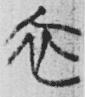衣
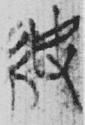○（袽）
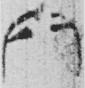夂（終）
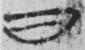日
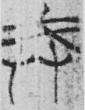戒
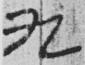九
